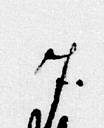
7.
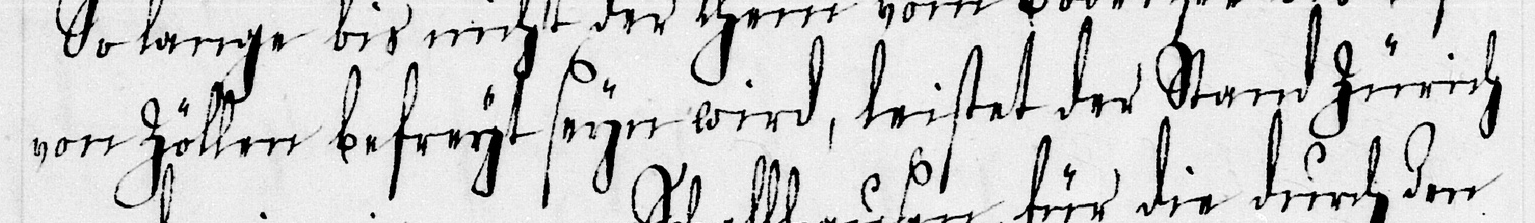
von Zöllen befreyt seyn wird, leistet der Stand Zürich
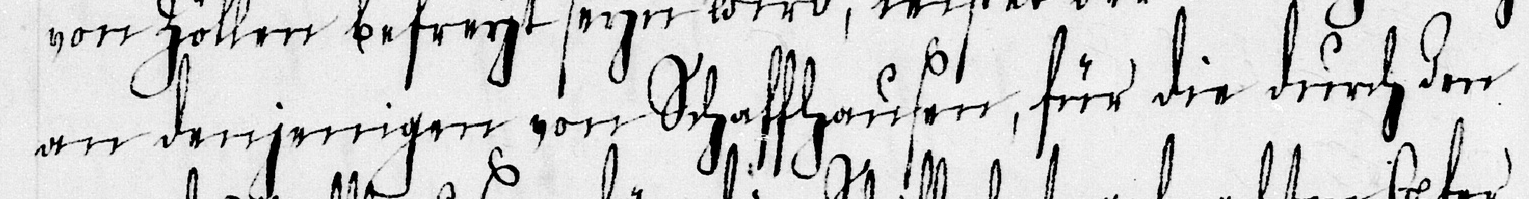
an denjenigen von Schaffhausen, für die durch den
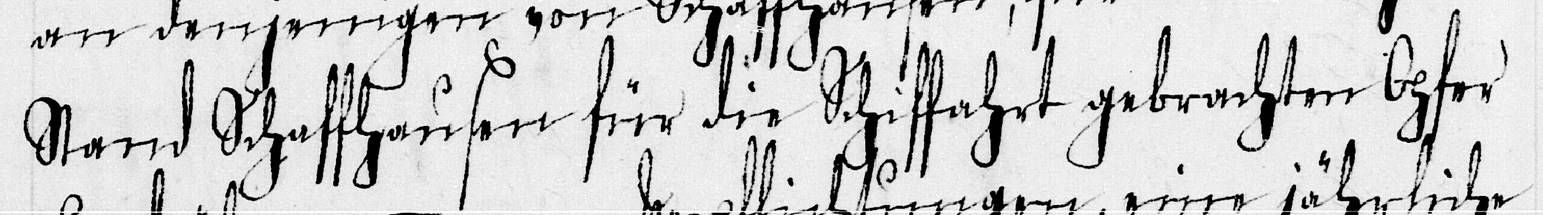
Stand Schaffhausen für die Schiffahrt gebrachten Opfer
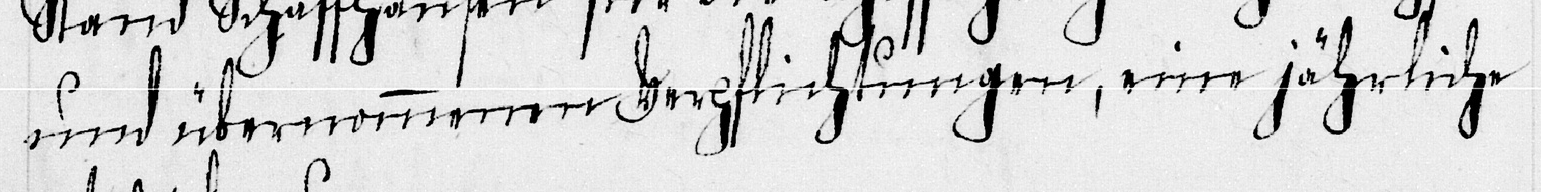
und übernommenen Verpflichtungen, eine jährliche
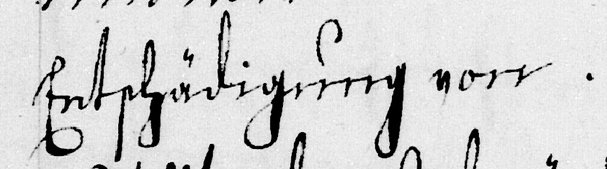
Entschädigung von
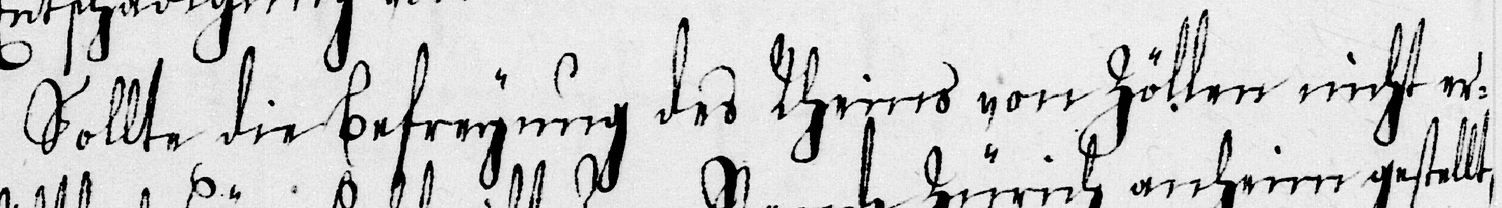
Sollte die Befreyung des Rheins von Zöllen nicht er¬
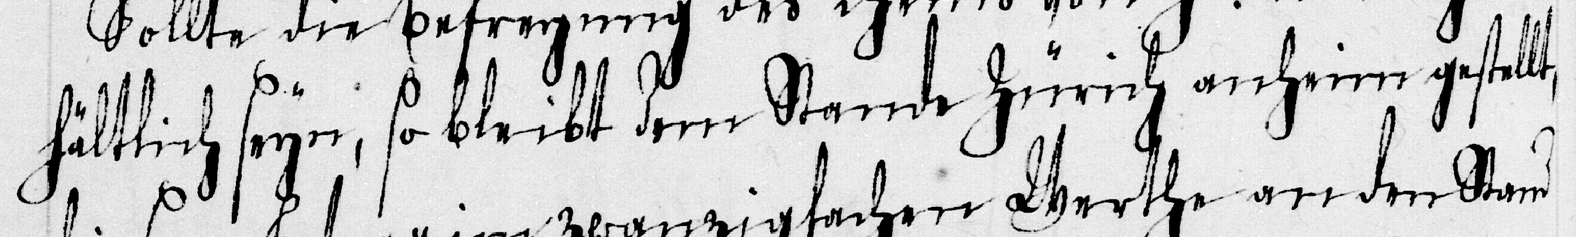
hältlich seyn, so bleibt dem Stande Zürich anheim gestel¬
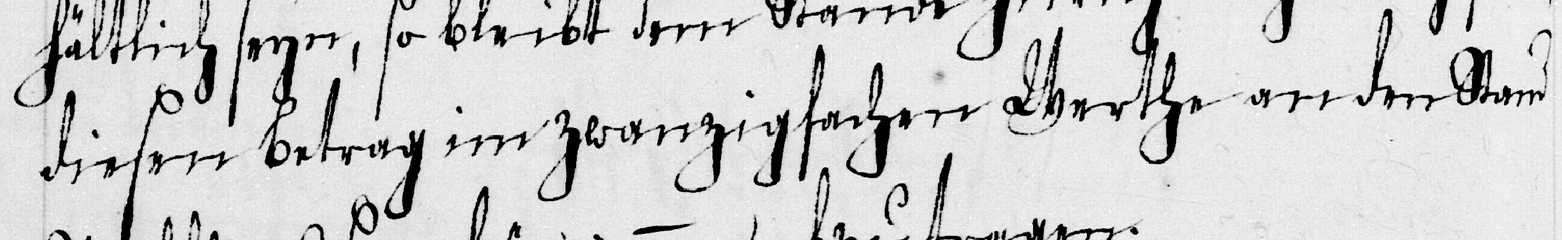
diesen Betrag im zwanzigfachen Werthe an den Stand
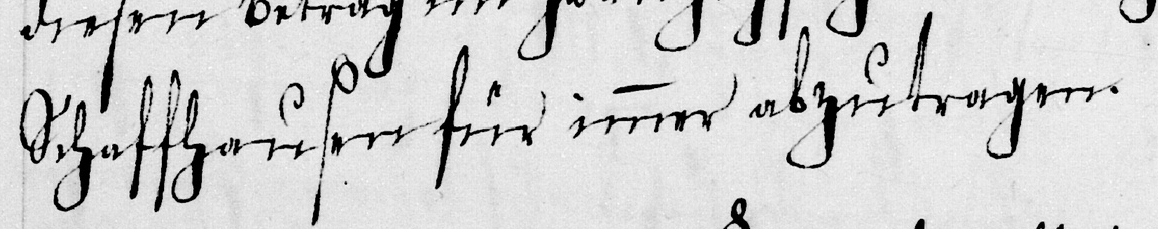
Schaffhausen für immer abzutragen.
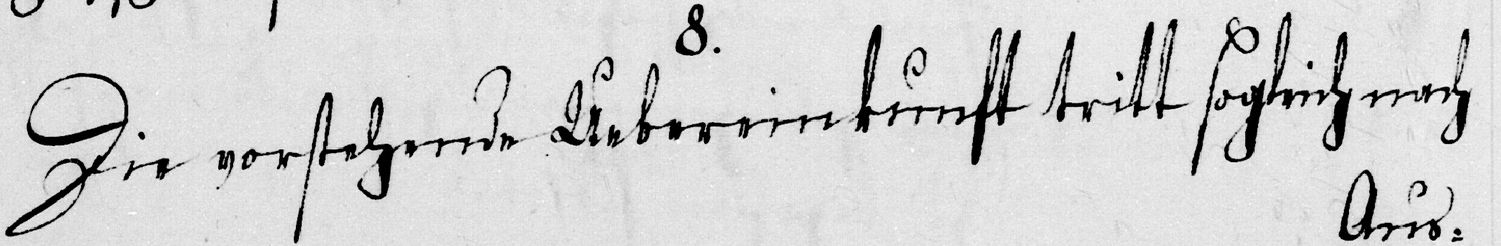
Die vorstehende Uebereinkunft tritt sogleich
